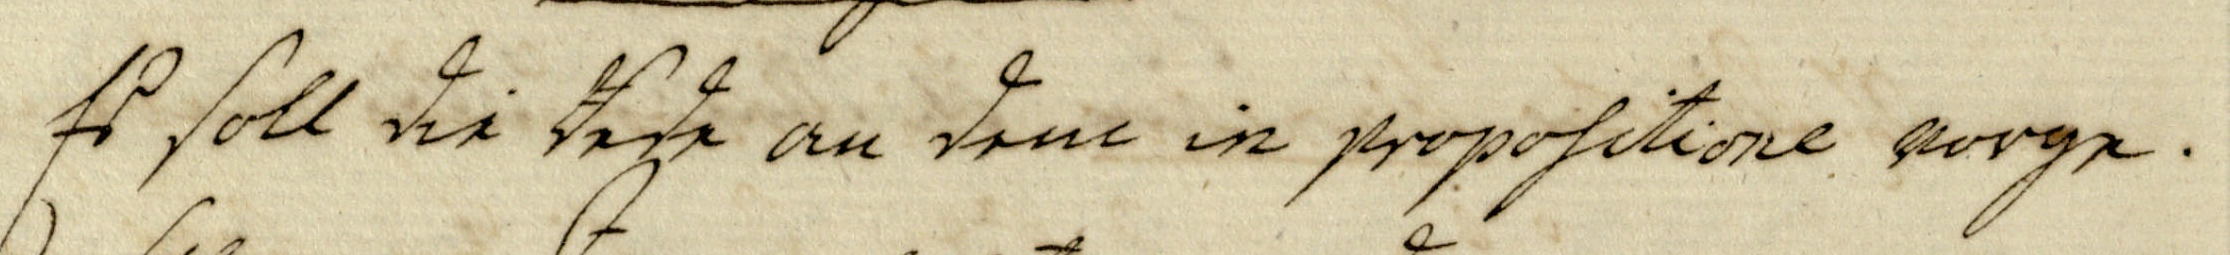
Es soll die Rede an dem in propositione vorge¬
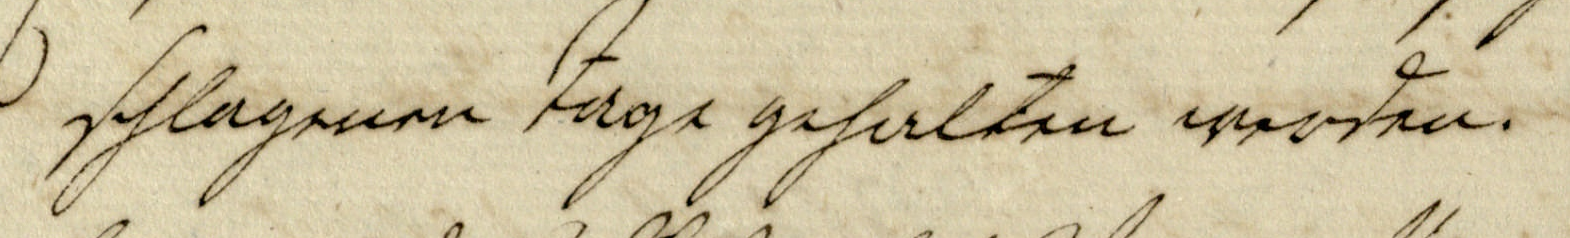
schlagenen Tage gehalten werden.
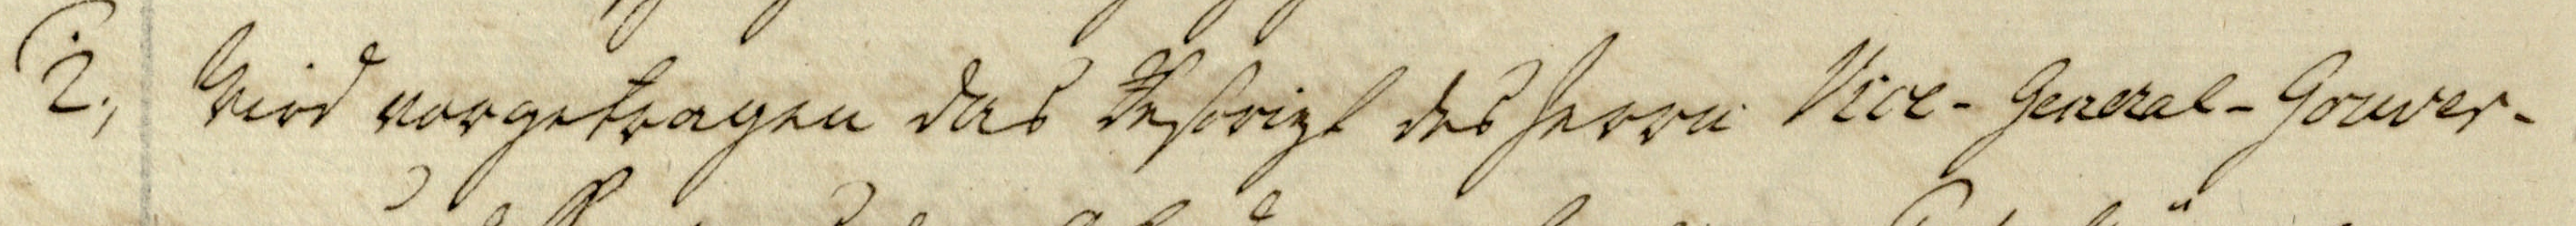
2., Wird vorgetragen das Rescript des Herrn Vice- General- Gouver¬
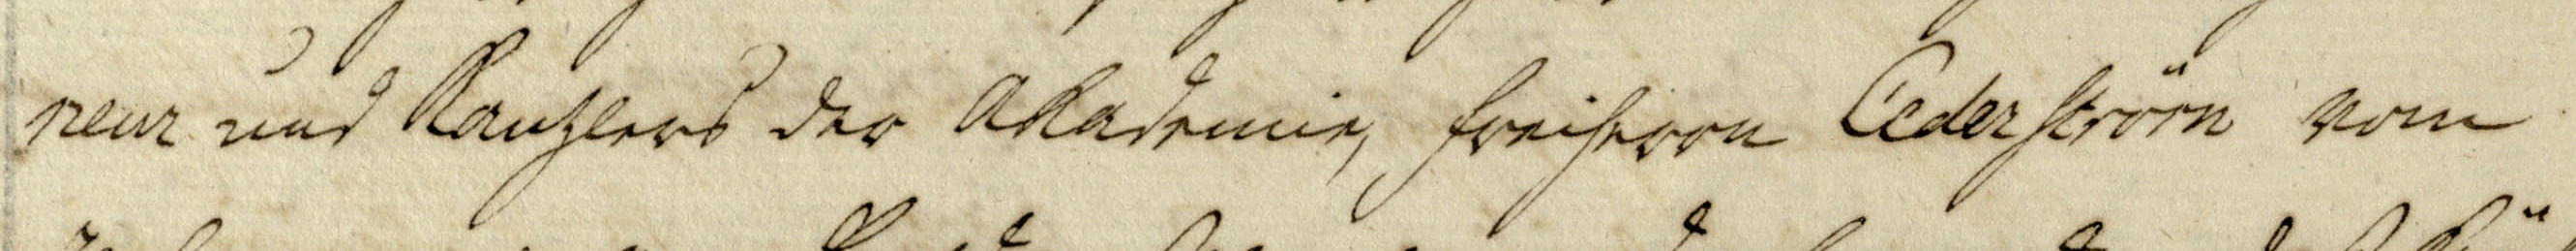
neur und Kanzlers der Akademie, Freiherrn Cederström vom
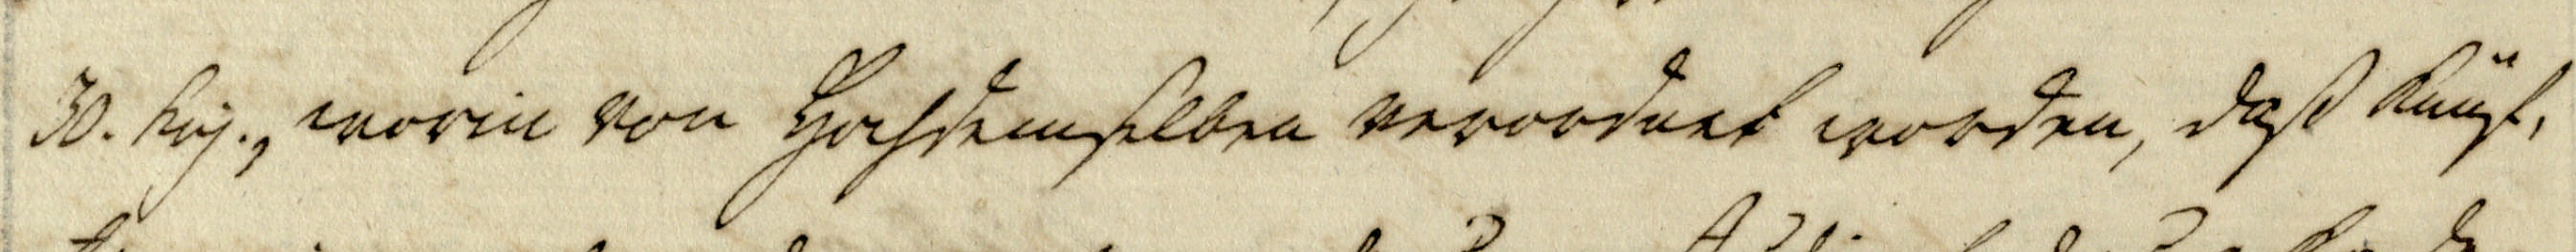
30. huj., worin von Hochdemselben verordnet worden, daß künf¬
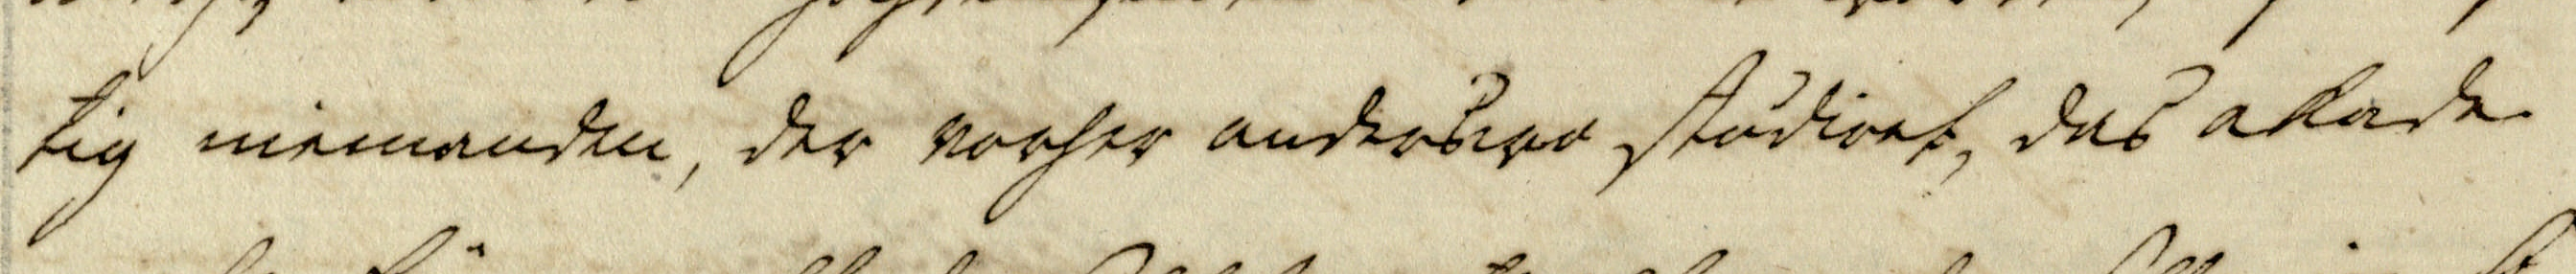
tig niemanden, der vorher anderswo studiret, das akade¬
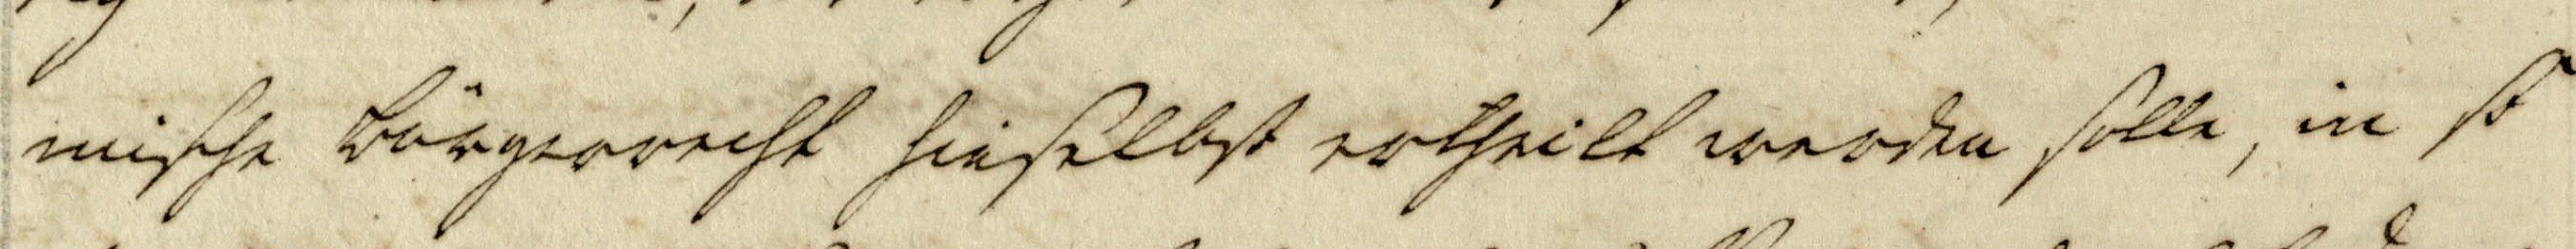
mische Bürgerrecht hieselbst ertheilt werden solle, in so
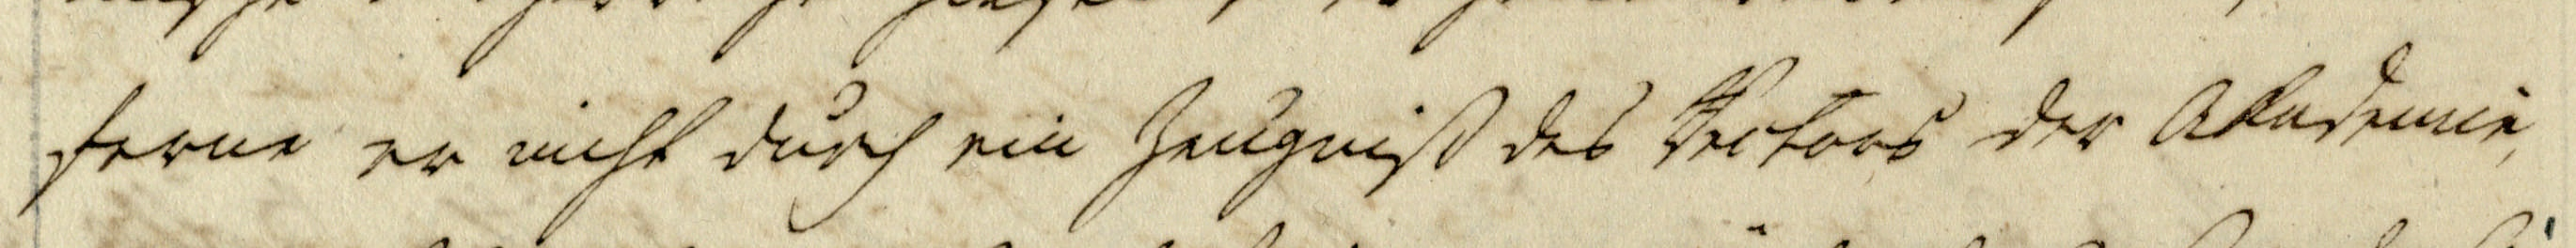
ferne er nicht durch ein Zeugniß des Rectors der Akademie,
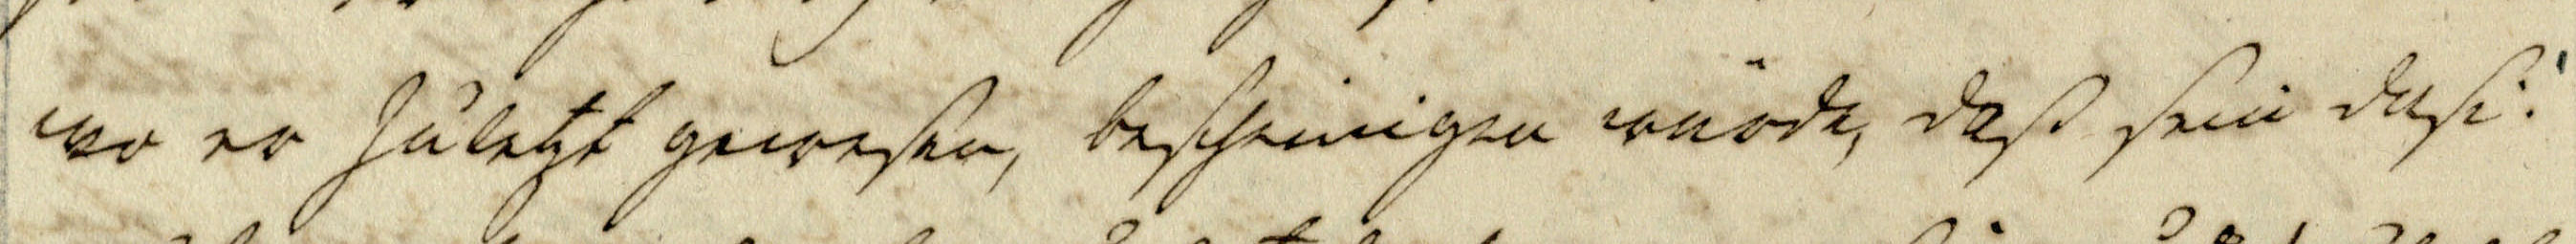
wo er zuletzt gewesen, bescheinigen würde, daß sein dasi¬
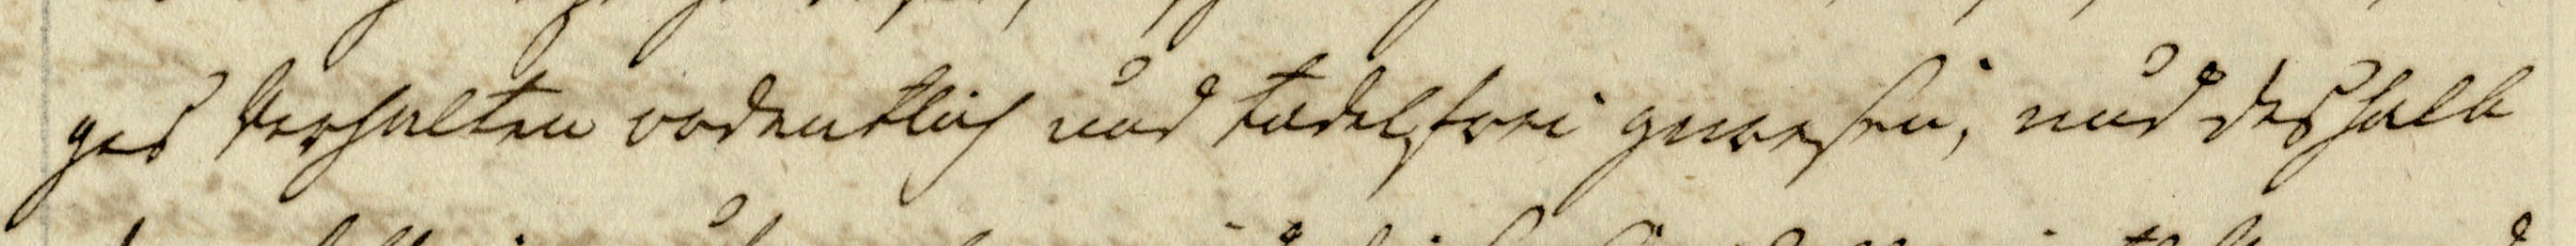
ges Verhalten ordentlich und tadelfrei gewesen, und deshalb
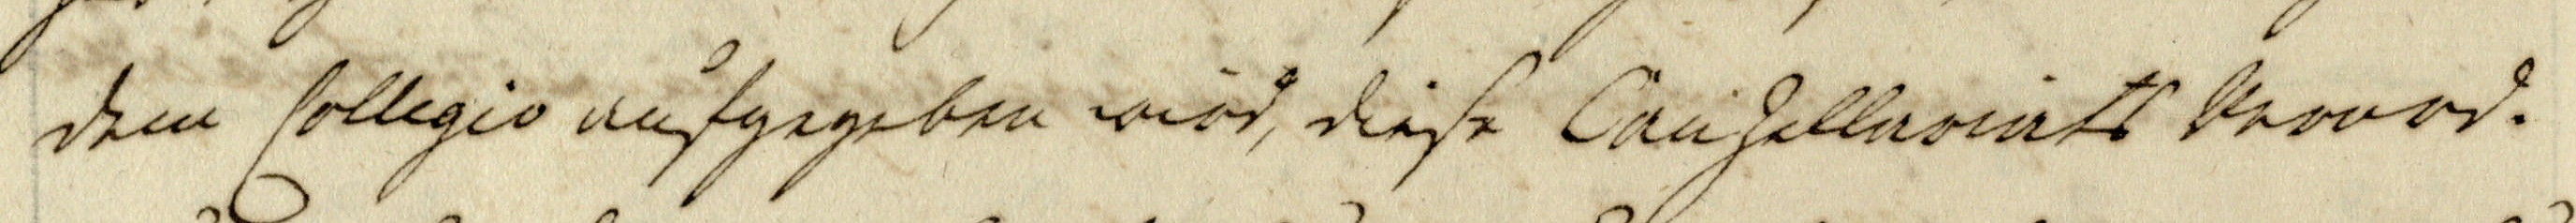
dem Collegio aufgegeben wird, diese Canzellariats Verord¬
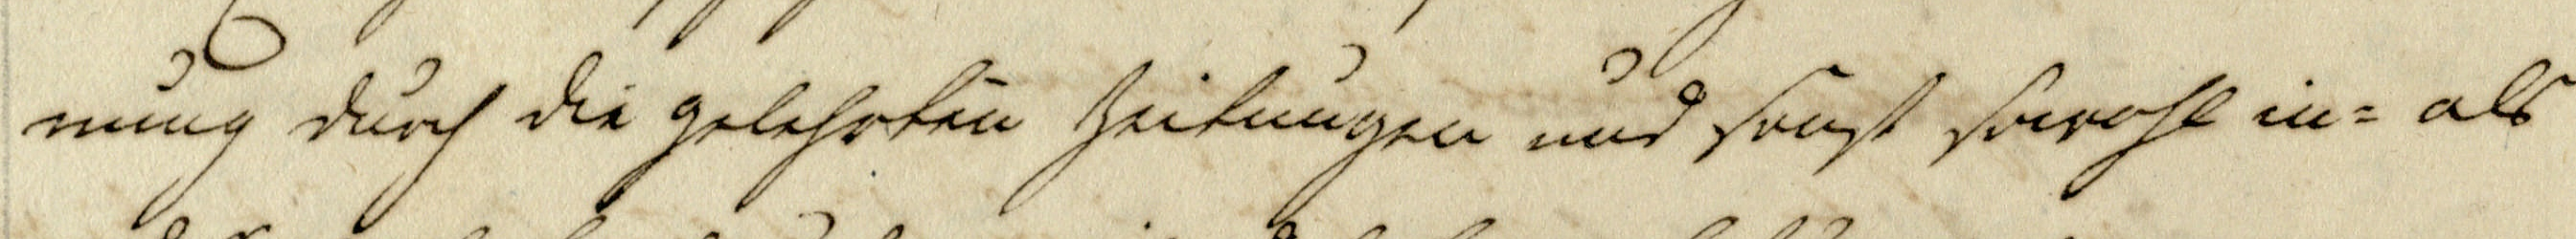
nung durch die gelehrten Zeitungen und sonst sowohl in- als
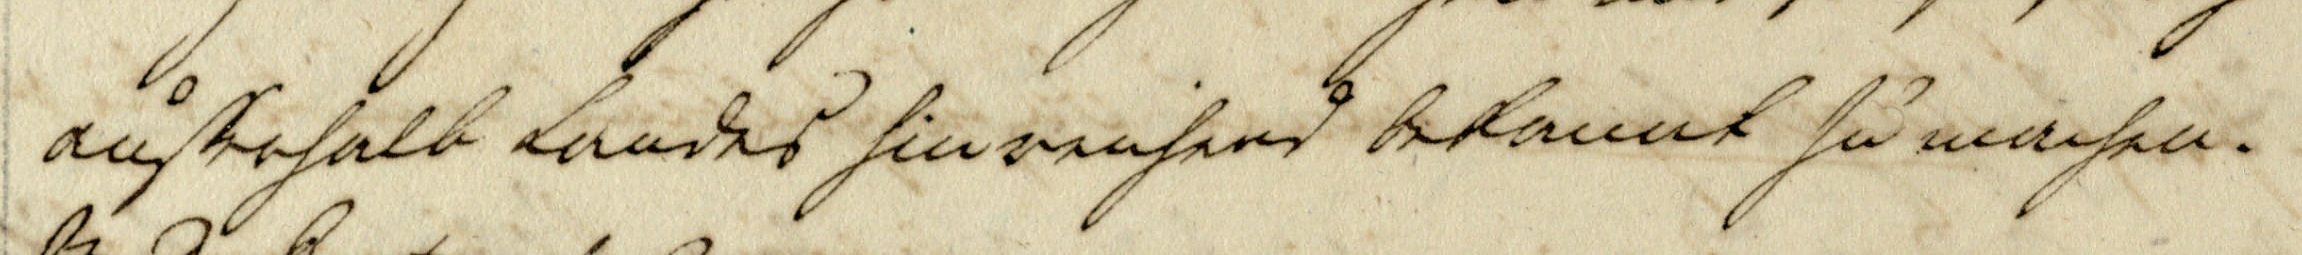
ausserhalb Landes hinreichend bekannt zu machen.
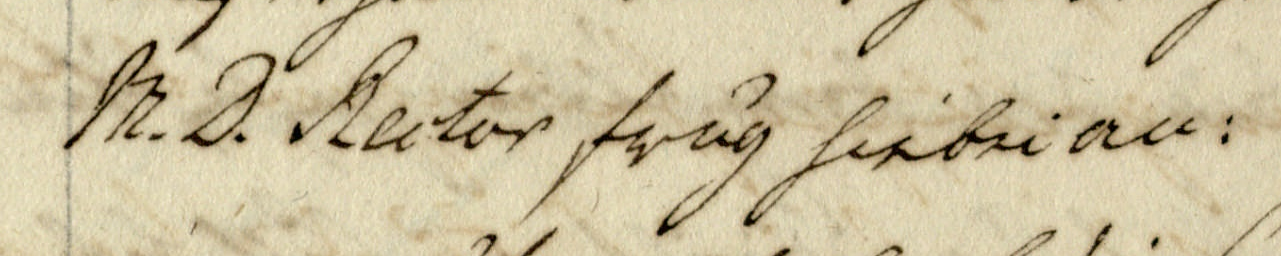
M. D. Rector frug hiebei an:
